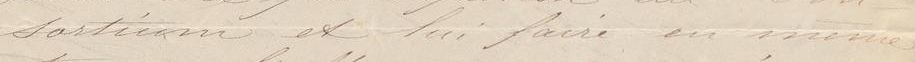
sortium et lui faire en même
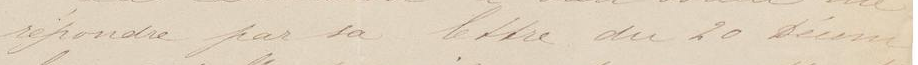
répondre par sa lettre du 20 Décem-
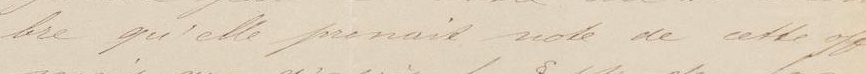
bre qu'elle prenait note de cette offre,,
